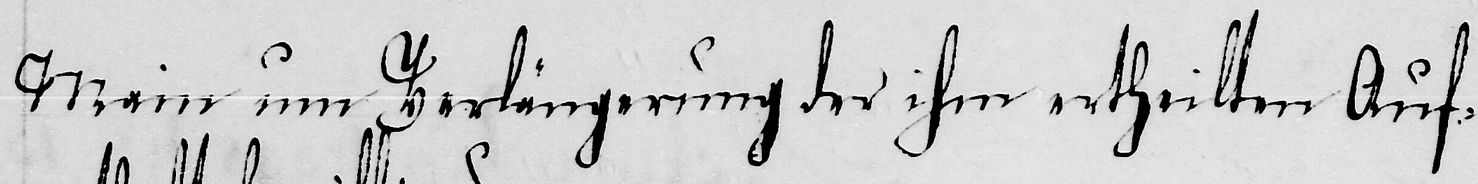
Main um Verlängerung der ihm ertheilten Auf¬
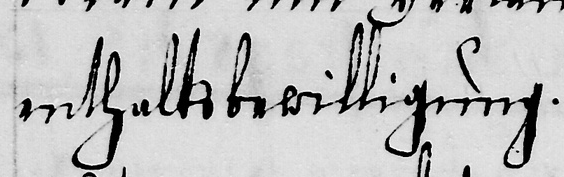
enthaltsbewilligung.
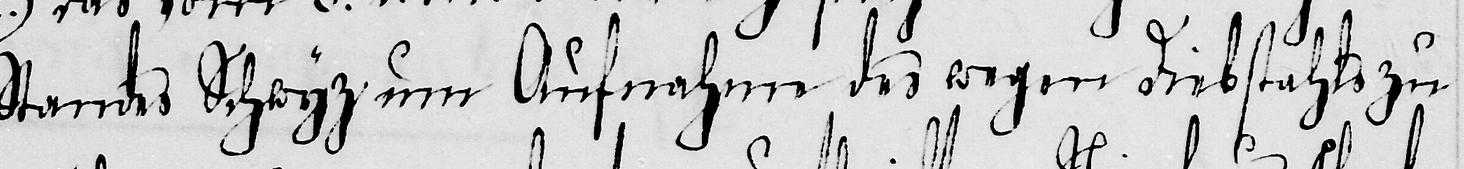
Standes Schwyz um Aufnahme des wegen Diebstahls zu
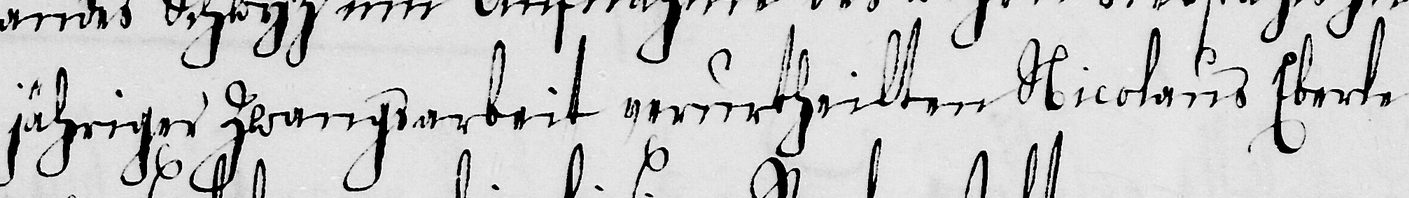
jähriger Zwangsarbeit verurtheilten Nicolaus Eberle
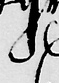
z.
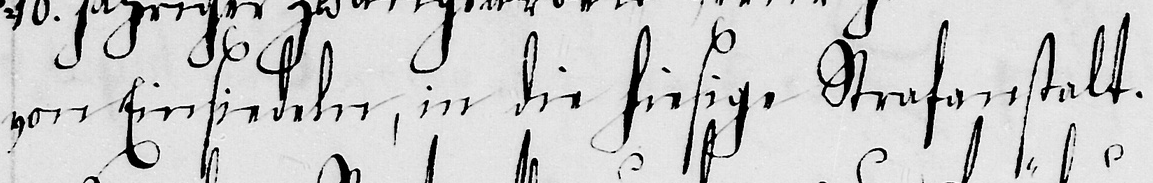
von Einsiedeln, in die hiesige Strafanstalt.
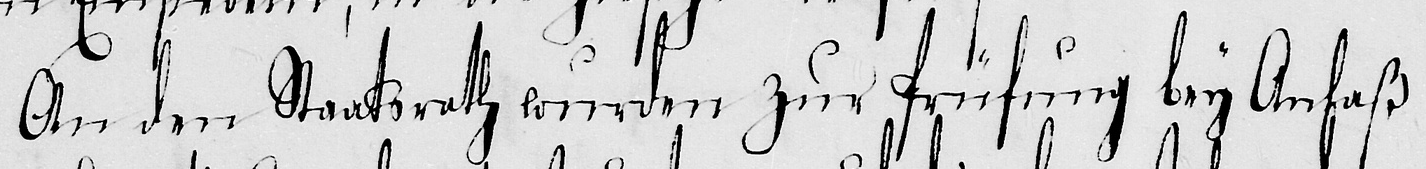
An den Staatsrath wurden zur Prüfung bey Anlaß
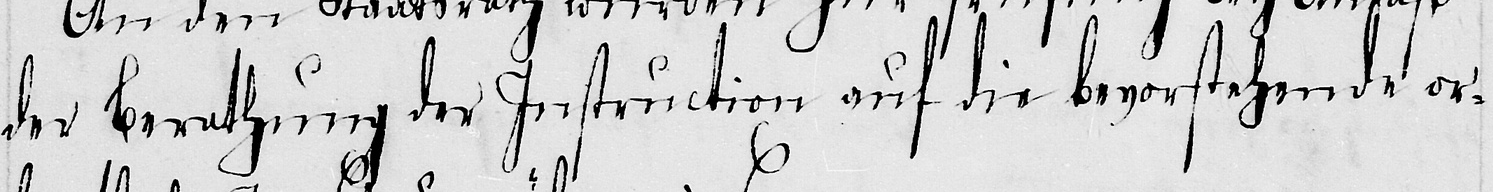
der Berathung der Instruction auf die bevorstehende or¬
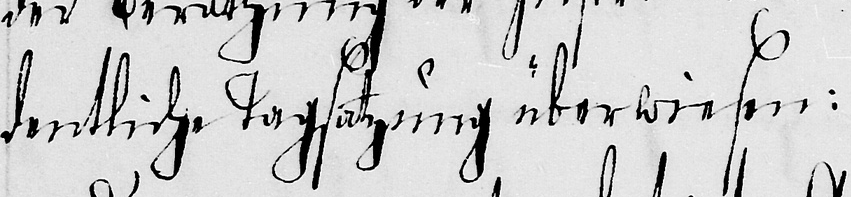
dentliche Tagsatzung überwiesen:
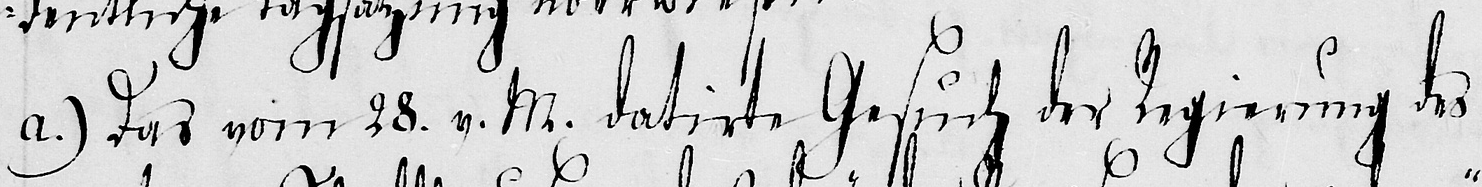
a.) Das vom 28. v. M. datirte Gesuch der Regierung des
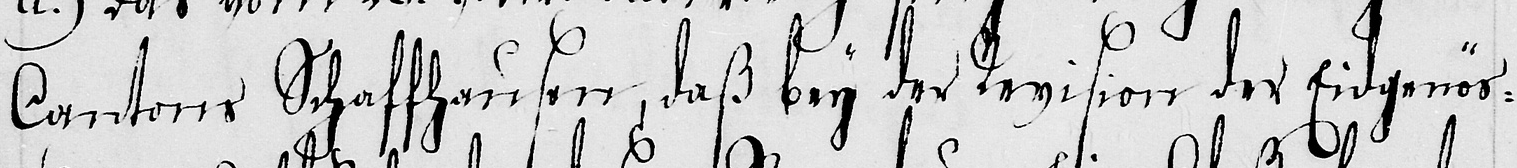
Cantons Schaffhausen, daß bey der Revision der Eidgenößi¬
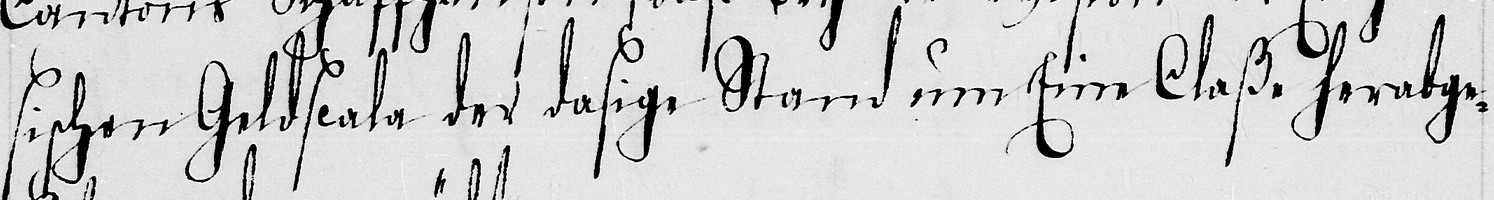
schen Geldscala der dasige Stand um Eine Claße herabge¬
